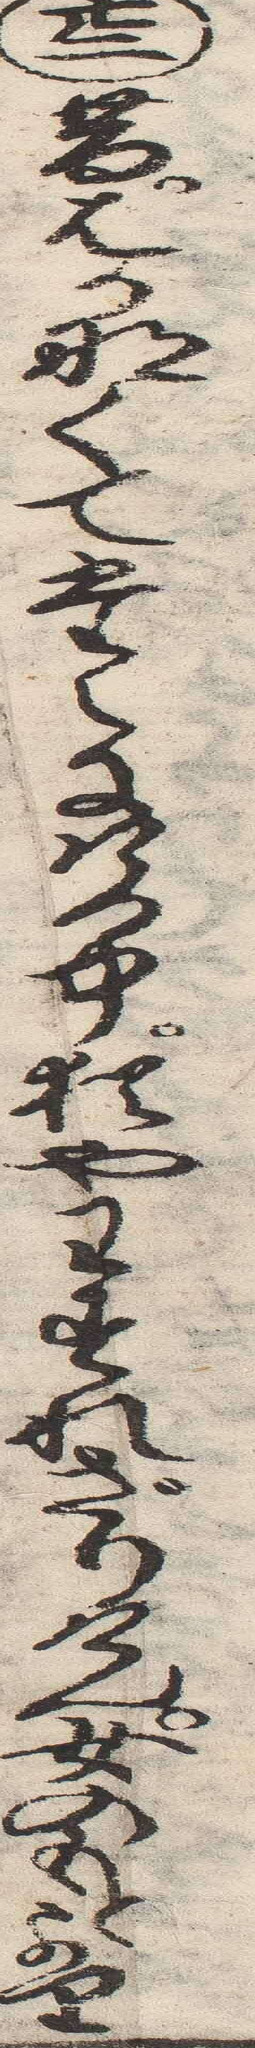廿二昔。はかなくてたえにける中。猶やわすれざりけん。女のもとより
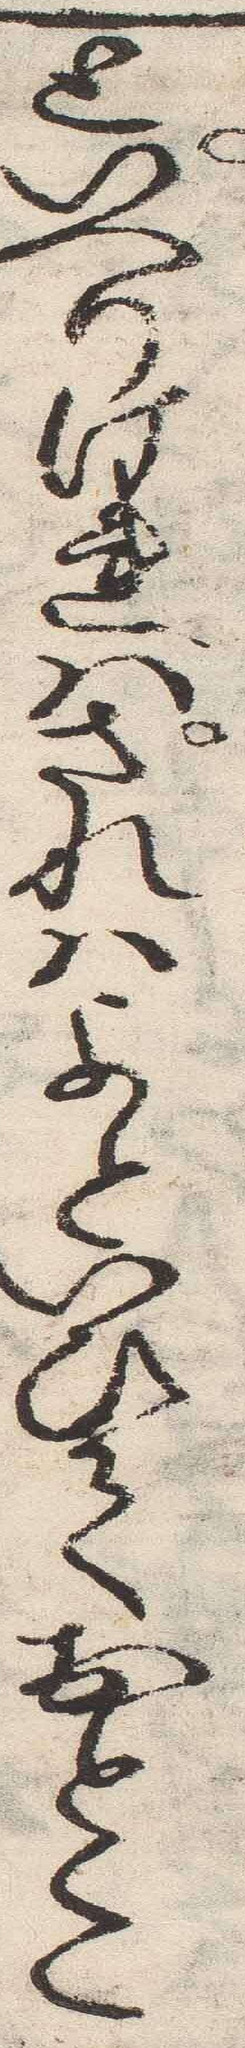と。いへりければ。されはよといひておとこ
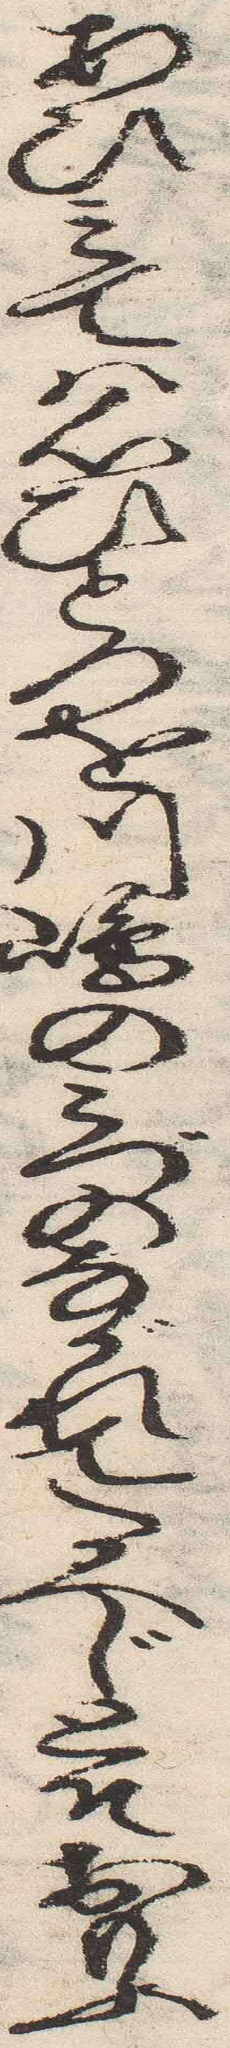あひみては心ひとつを川島のみづのながれてたへじとそおもふ
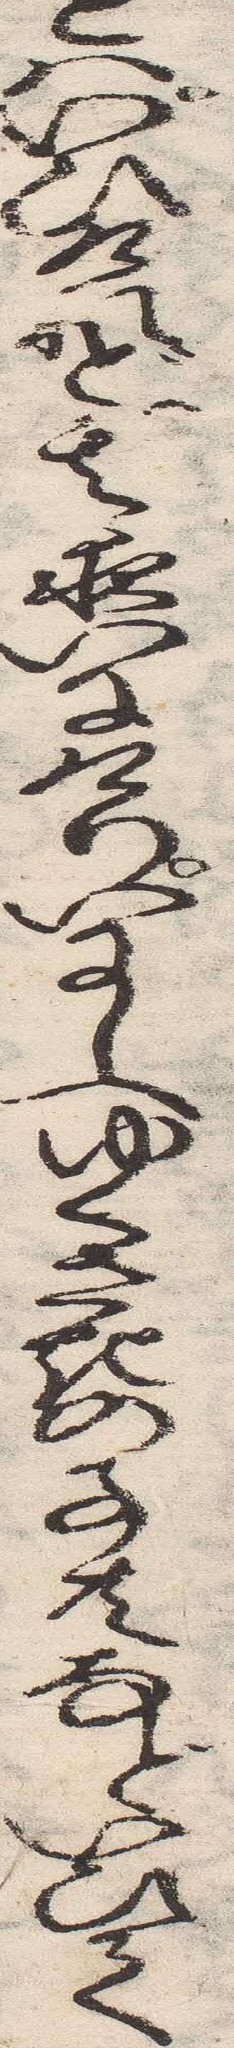とは。いひけれど。其夜いにけり。いにしへゆくさきの事共などいひて
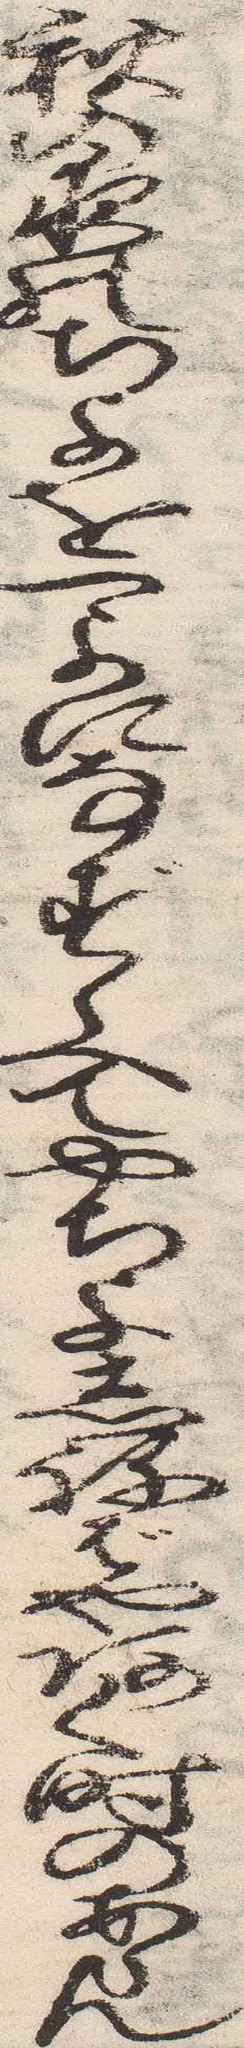秋の夜のちよを一よになずらへてやちよしねばやあく時のあらん
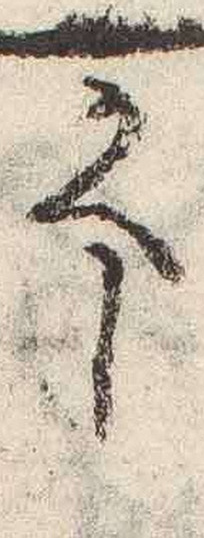かへし
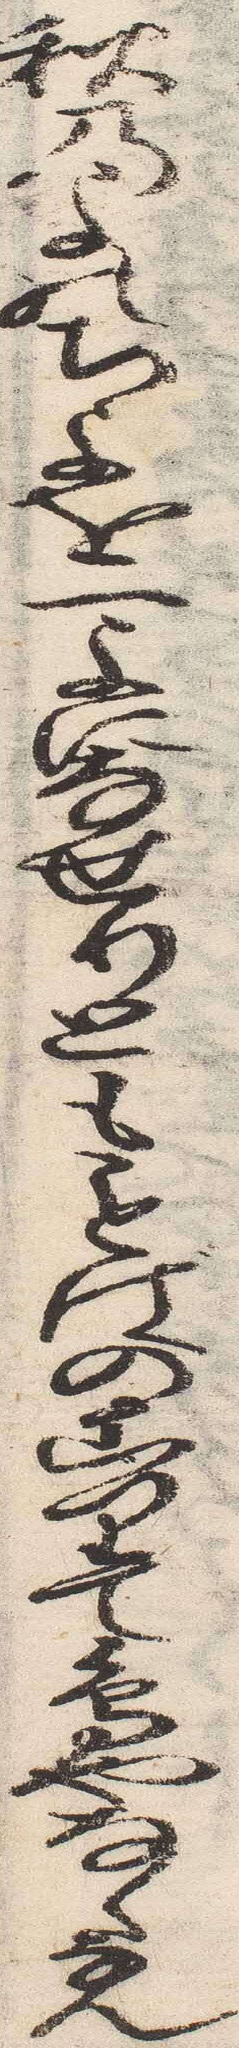秋のよのちよを一よになせりともことばのこりて鳥やなくなん

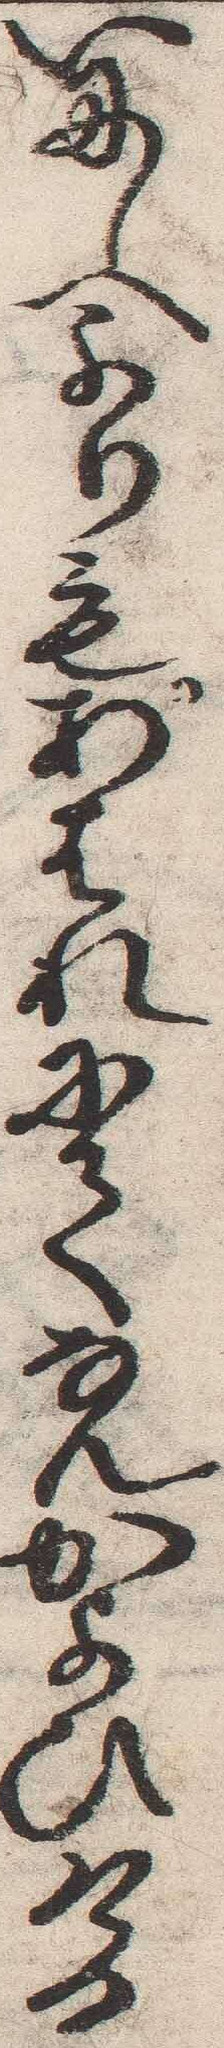いにしへよりも。あはれにてなんかよひける
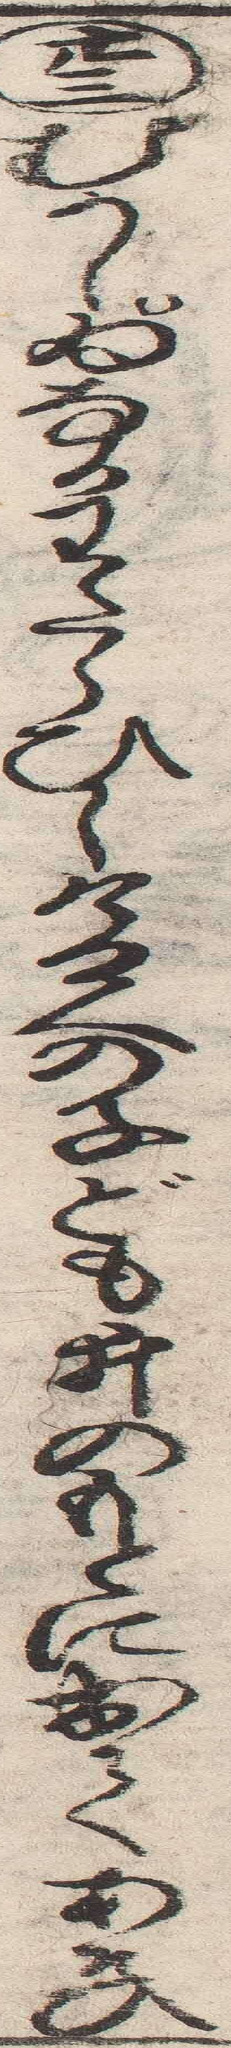廿三むかし。ゐなかわたらひしける人の子ども井のもとに出てあそひ
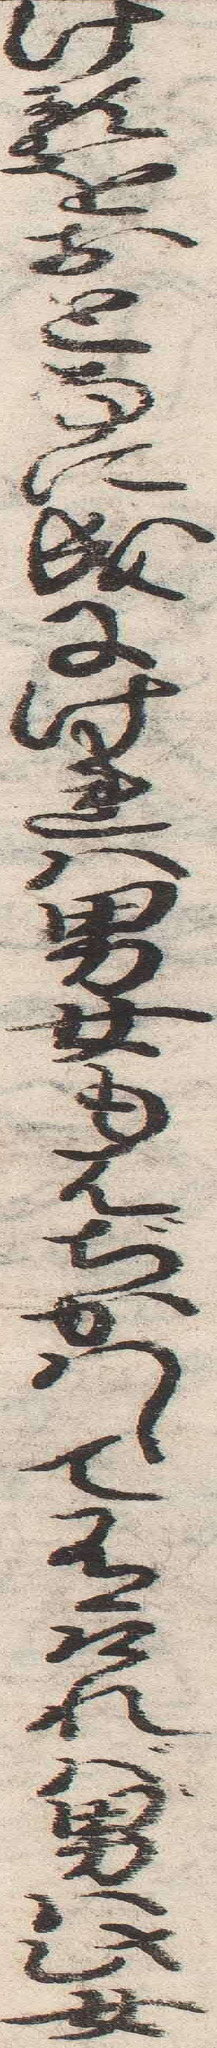けるをおとなに成にけれは男女もはぢかはして有ければ。男は此女
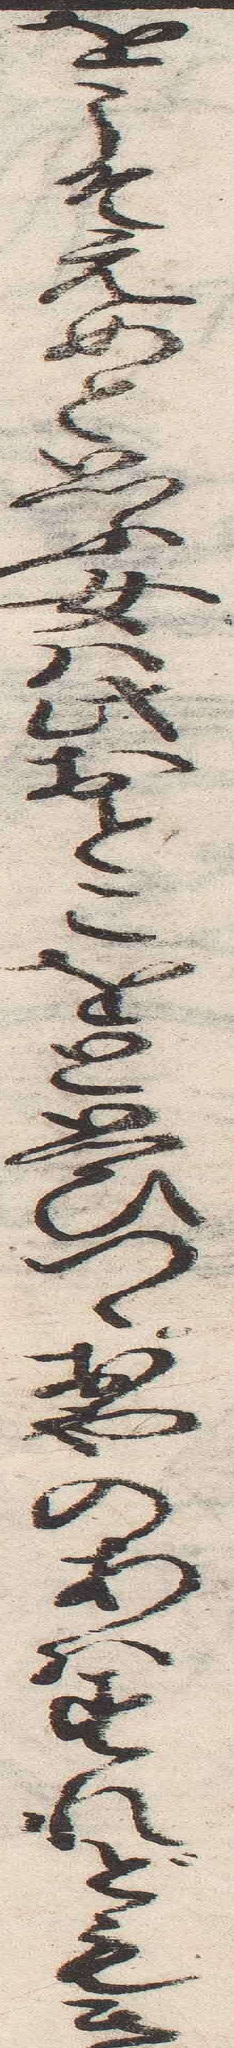をこそえめと思ふ女は此おとこをと思ひつゝ。おやのあはすれどもき
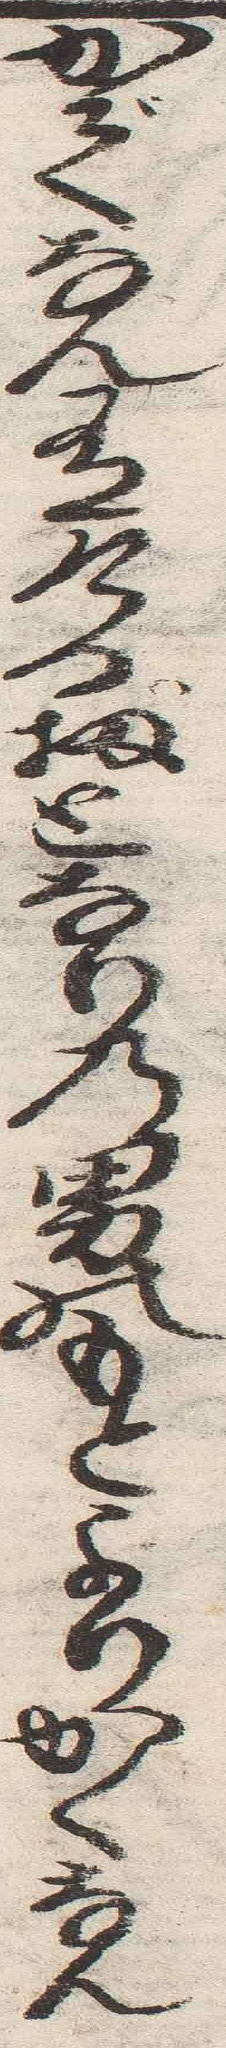かでなん有ける。扨となりの男のもとよりかくなん
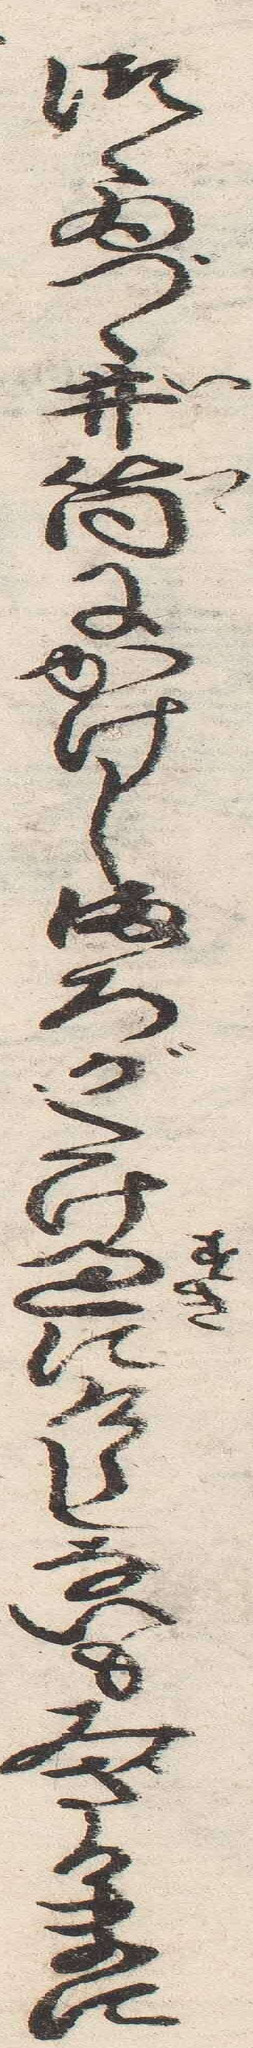つゝゐづゝ井筒にかけしまろがたけ過にけらしないもみさるまに
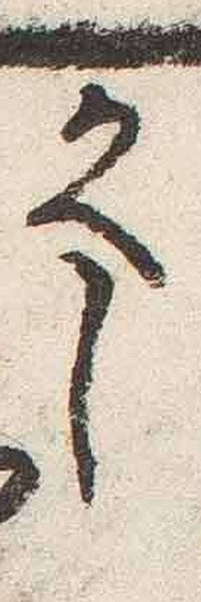かへし
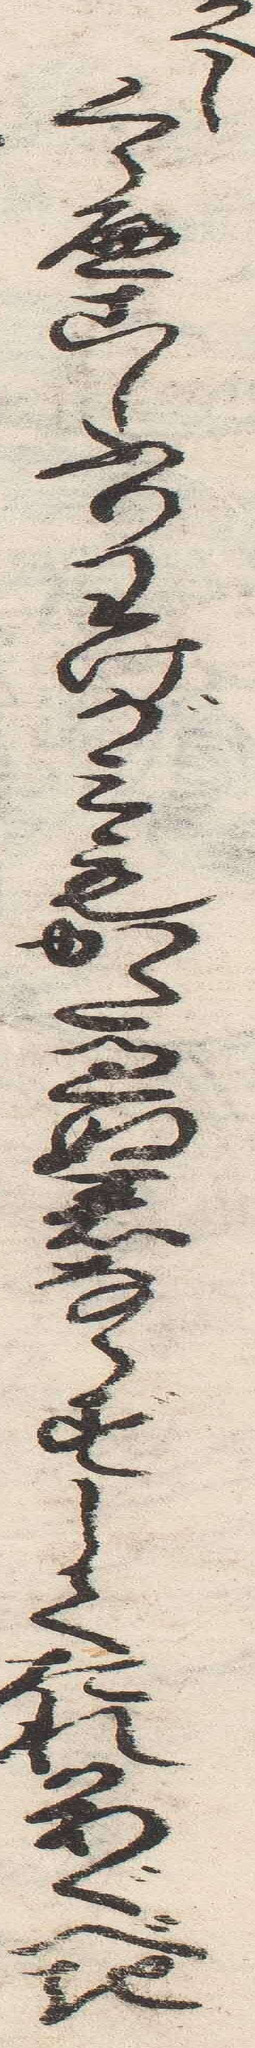くらへこしふりわけがみもかた過ぬ君ならずしてたれかあぐべき
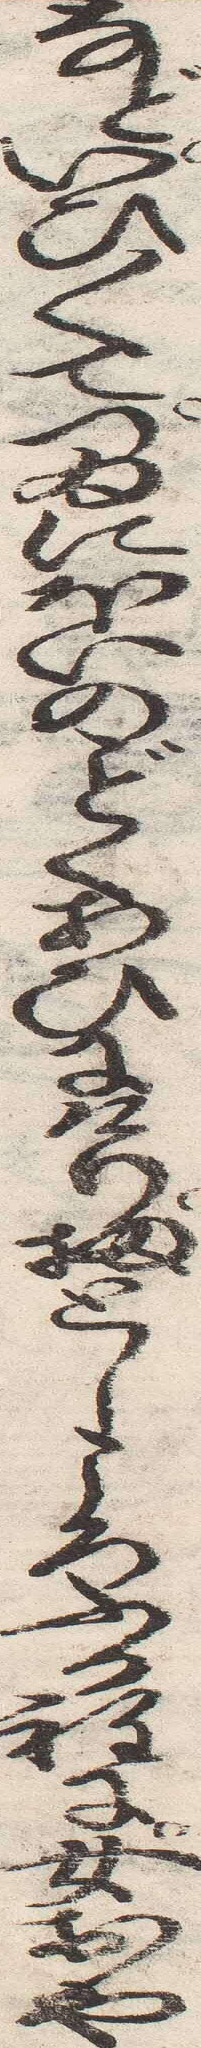など。いひ〳〵て。つゐにほいのごとくあひにけり。扨としころふる程に。女おや
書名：伊勢物語
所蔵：東京学芸大学附属図書館 国文学研究資料館
